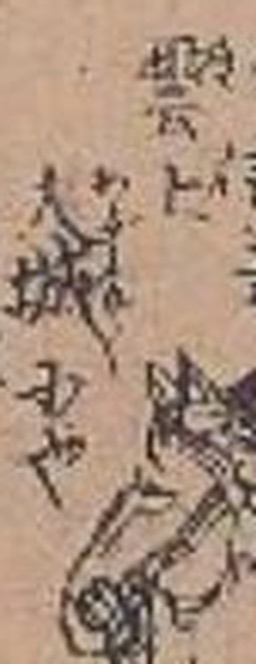大城にや
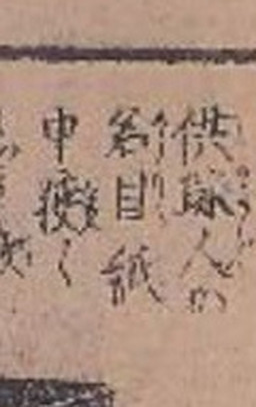名目紙
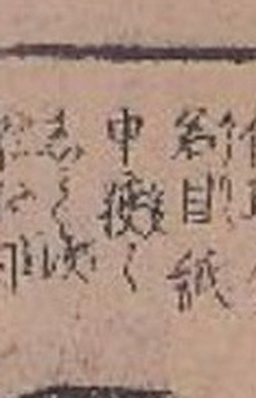中狭く
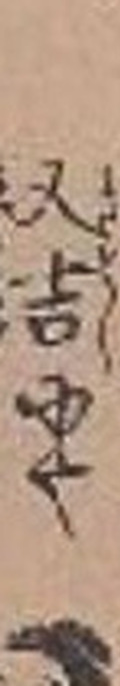又吉にや
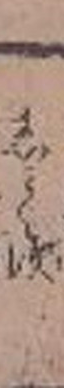して次
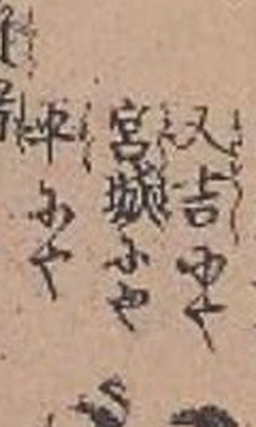宮城にや
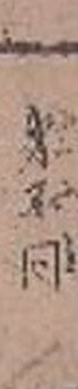第不同
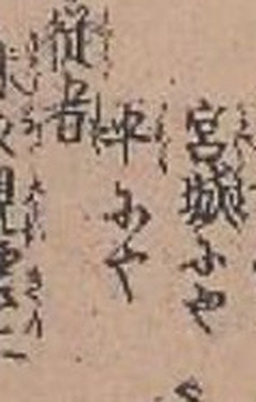平にや
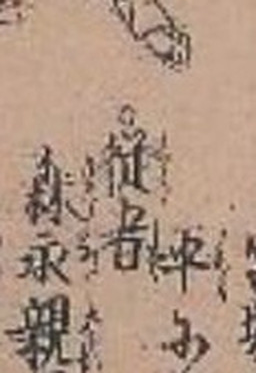○従者
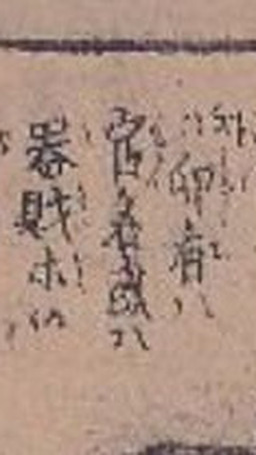官名或は
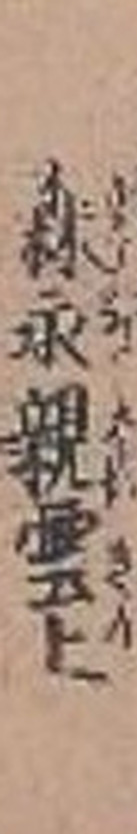森永親雲上
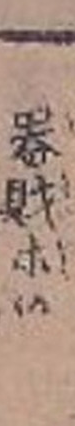器財等の
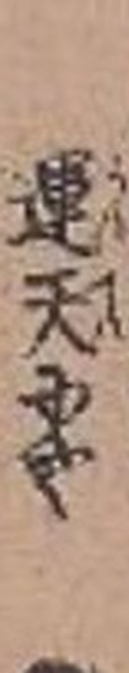運天にや
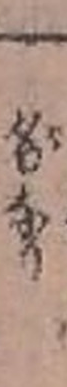名なり
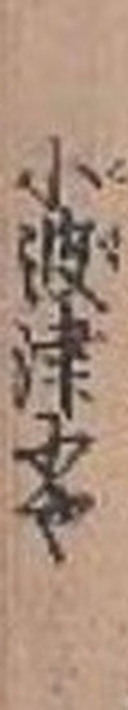小波津にや

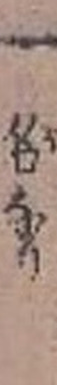幟なり
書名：琉球人行列附 天保十三壬寅年十一月
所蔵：University of the Ryukyus Library
